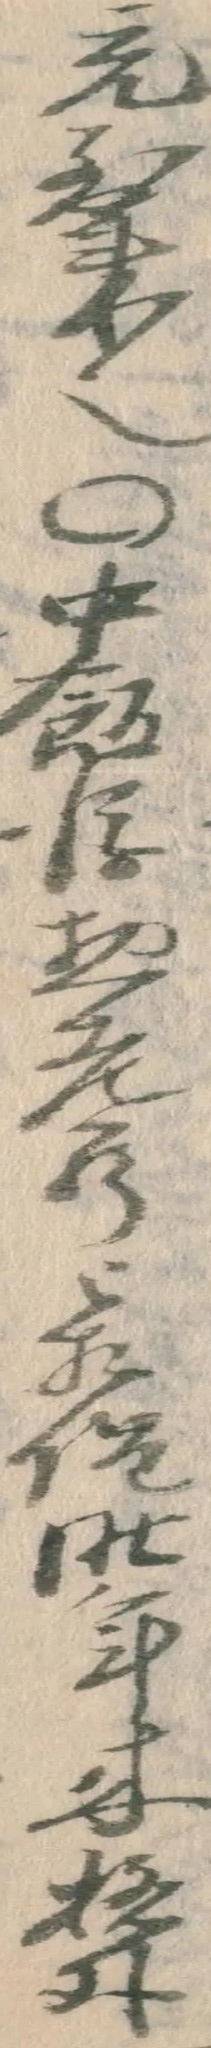充到来也〇中飯後惣老若被相催昨年来格外
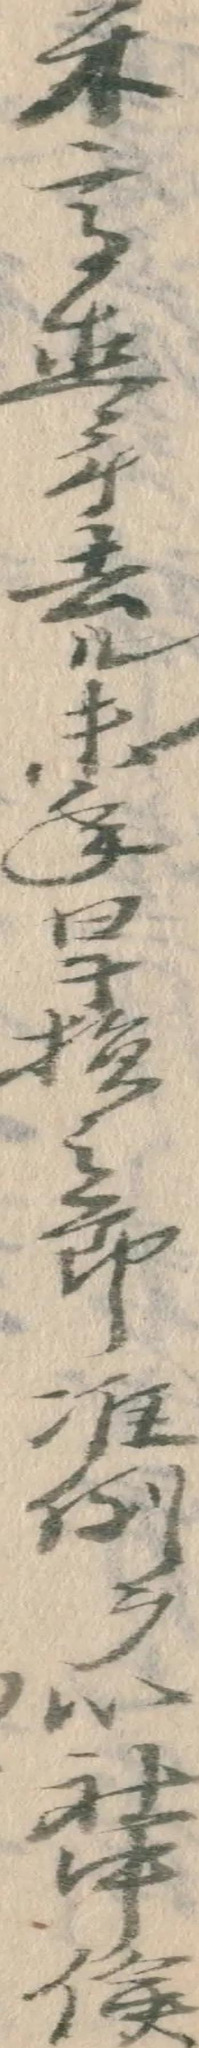米高直ニ付去ル未年旱損之節准例ヲ以社中ノ倹
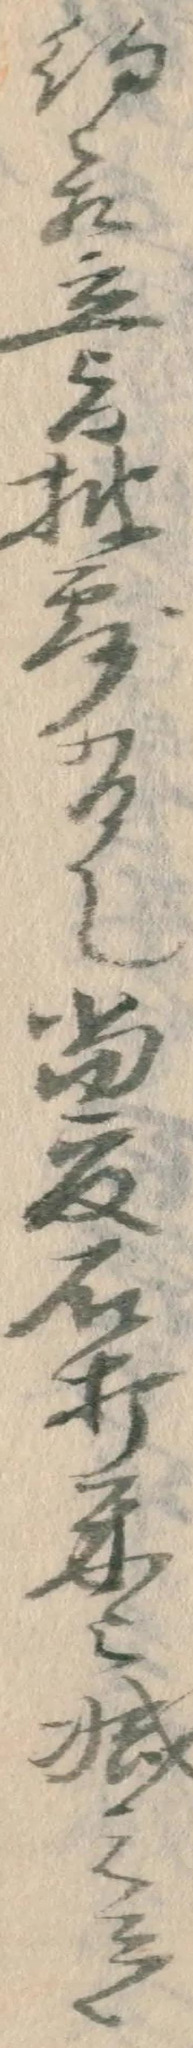約相立旨披露有之當夏石打米被減之云々
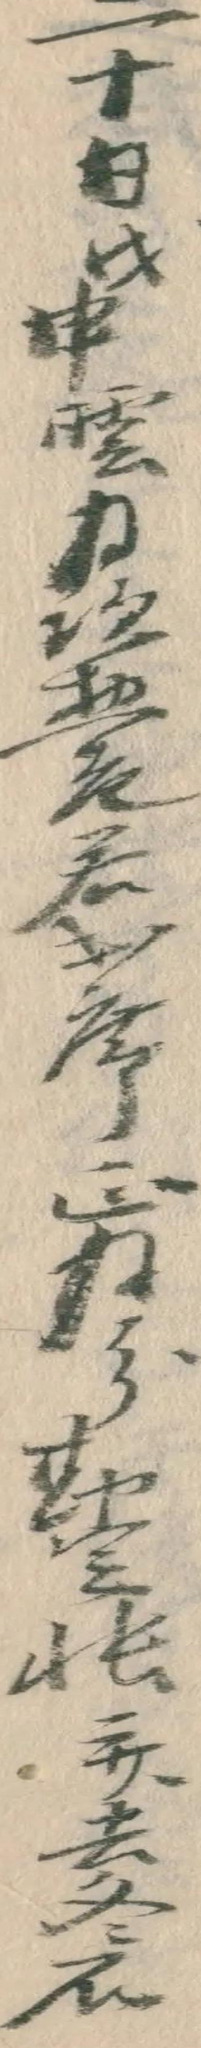三十日戊申曇月次惣老若出席正月分勘定帳并去冬石
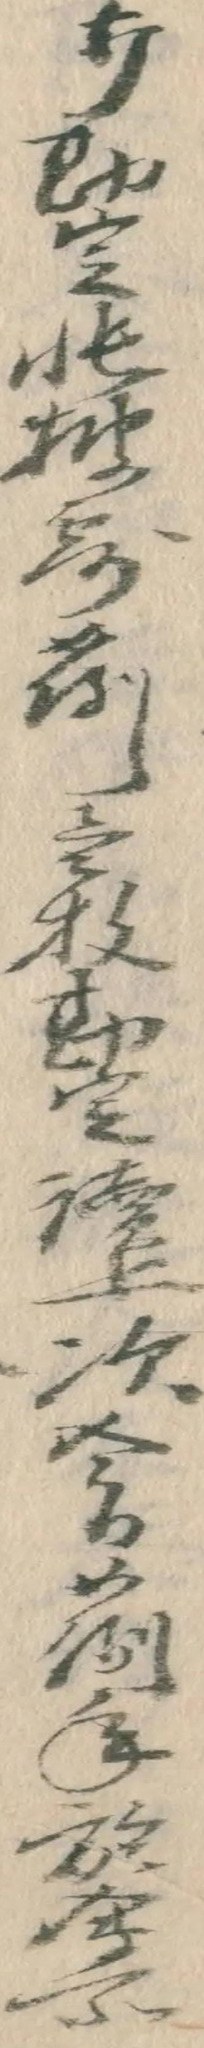打勘定帳能披露如例壱枚勘定讀上次今日御例年於會所
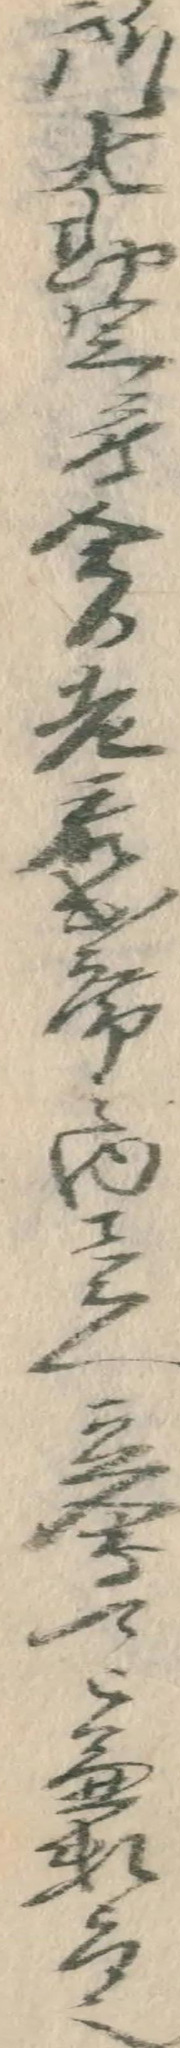所大勘定ニ付今日老若出席之内壱人立會可被兼頼旨也

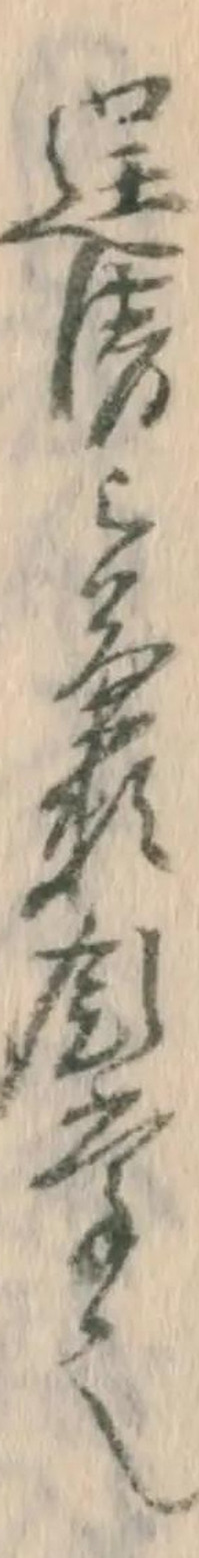逞清被兼頼領掌也
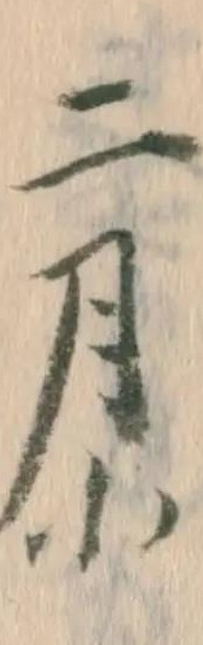二月小
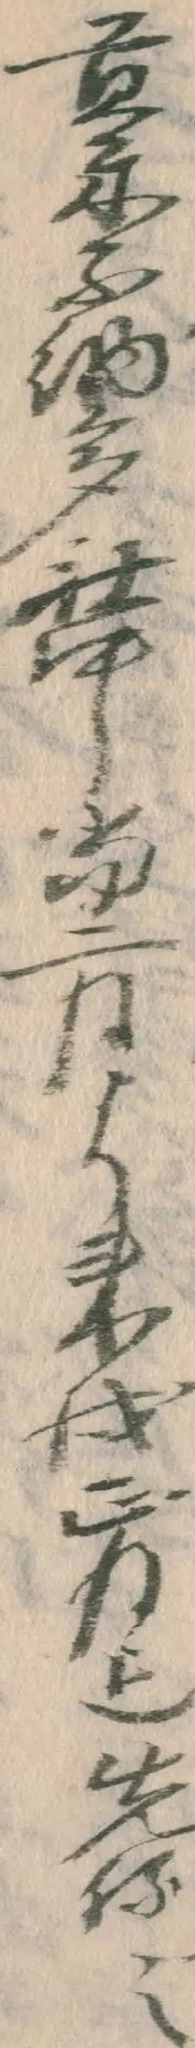貢米不納多社中當二月より来戌正月迄先例也
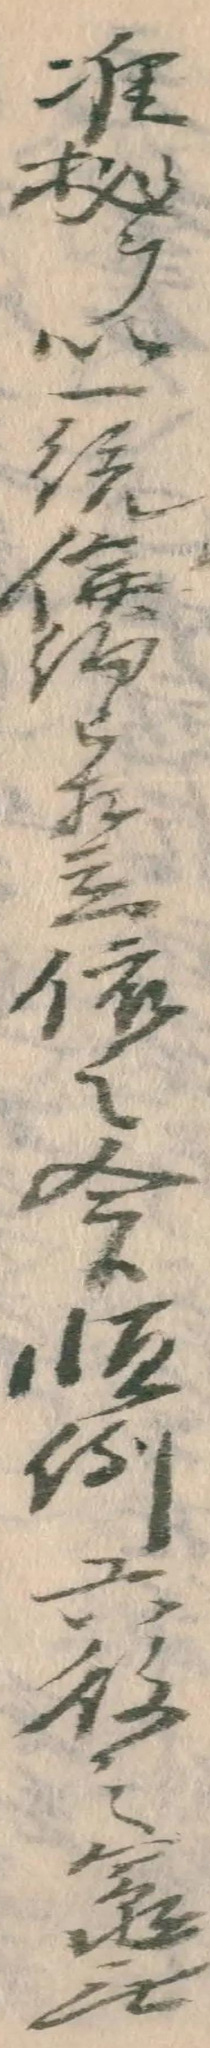准拠ヲ以一統倹約被相立依之今日恒例六役之鬮無
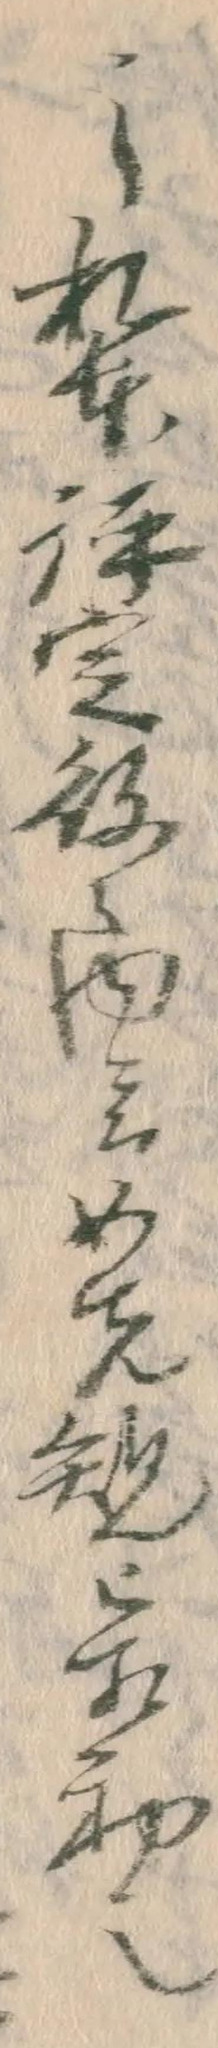之札本評定役之内ニ而如先規被相勤也
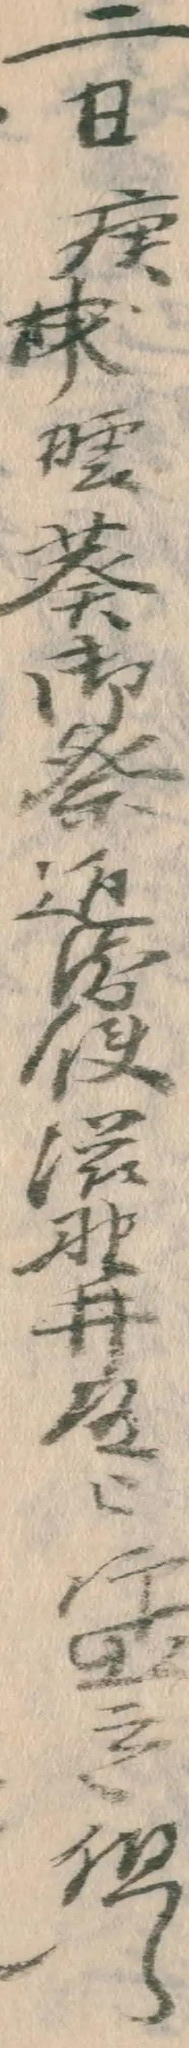二日庚戌曇葵御祭近習使滋野井殿被仰出云々但し
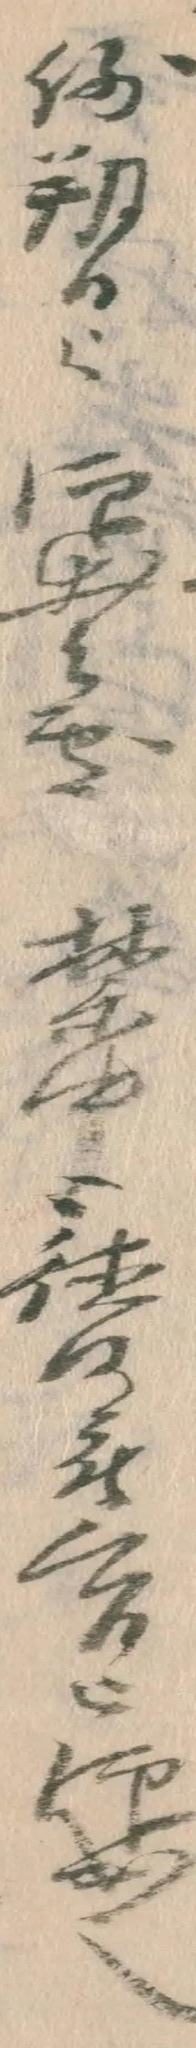例朔日被仰出候處禁中御徳日ニ付今日被仰出也
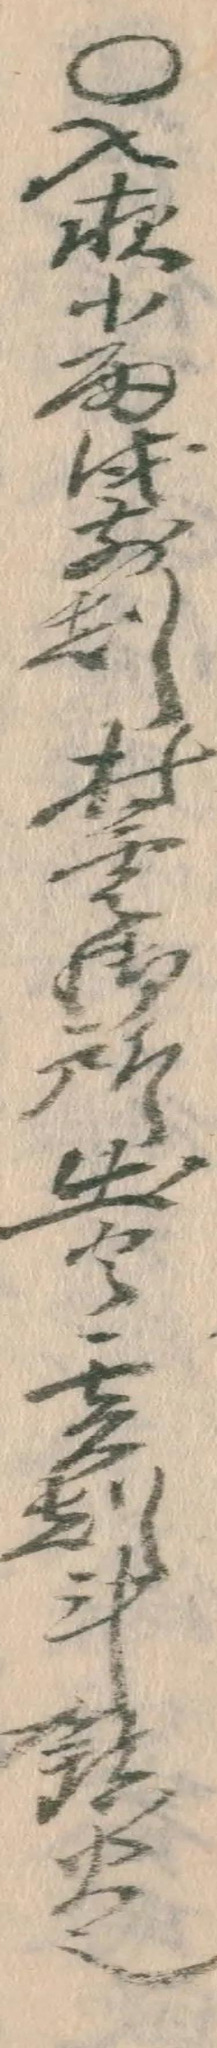○入夜小雨戌前刻村雲御所出火亥刻斗鎮火也
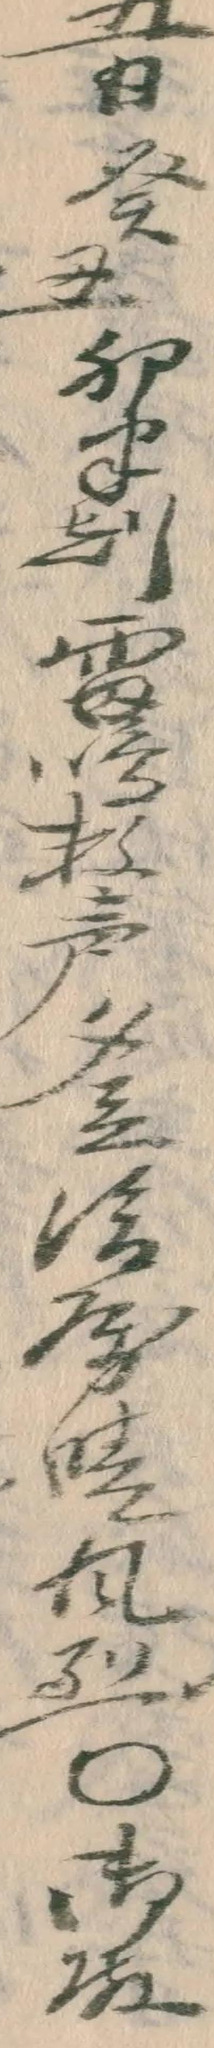五日癸丑卯半刻雷鳴数声夕立後属晴風烈〇御殿
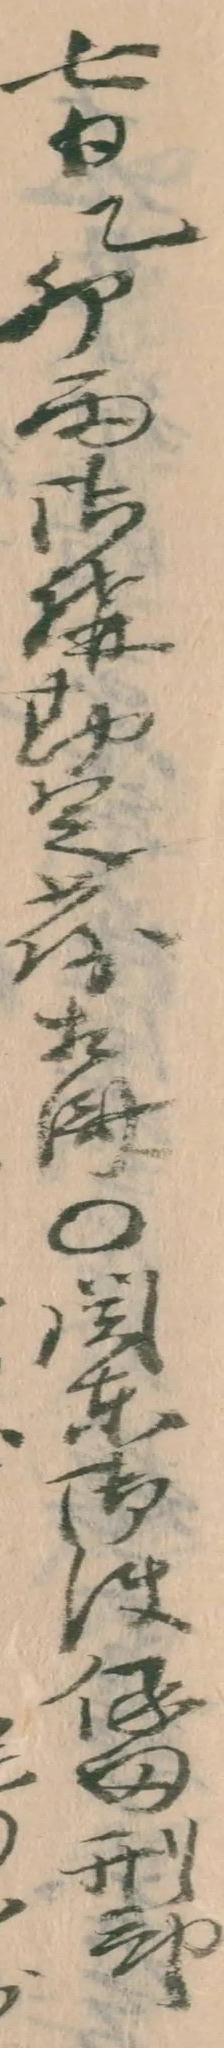七日乙卯雨御講勘定如何相済○関東御使保田刑部
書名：賀茂社記録. 第67冊
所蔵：国立国会図書館 National Diet Library, JAPAN
